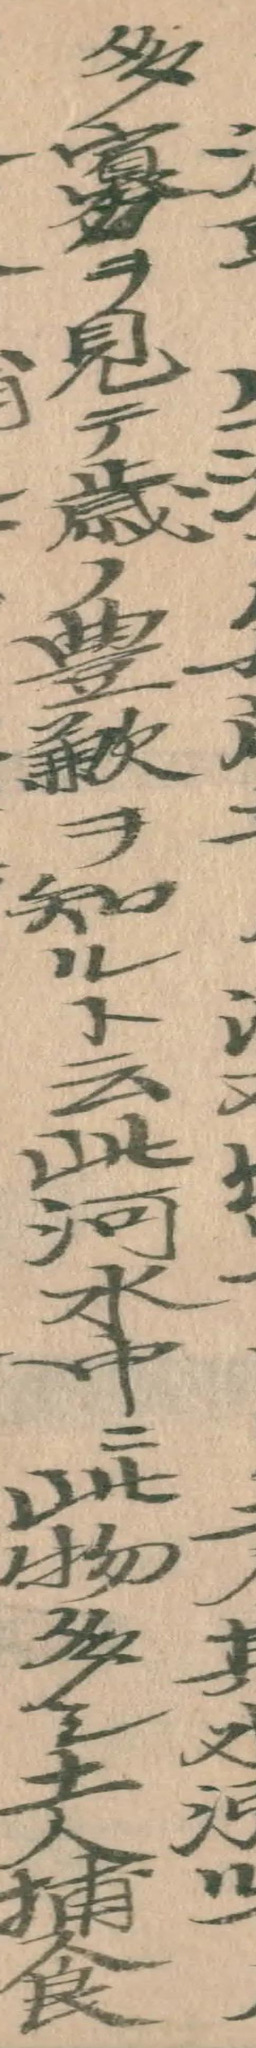多寡ヲ見テ歳ノ豊歉ヲ知ルト云此河水中ニ此物多シ土人捕食
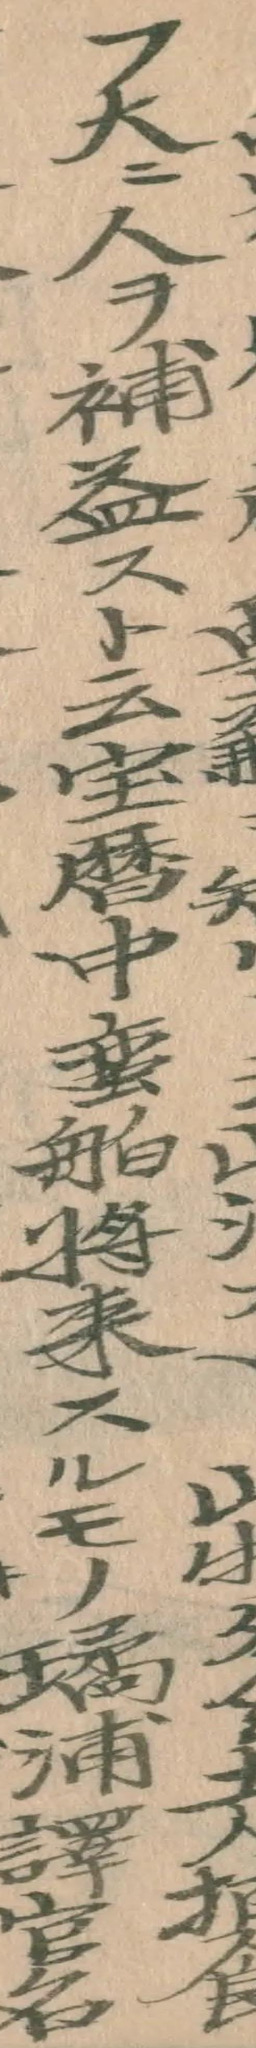フ大ニ人ヲ補益スト云宝暦中蛮舶將来スルモノ璚浦譯官名
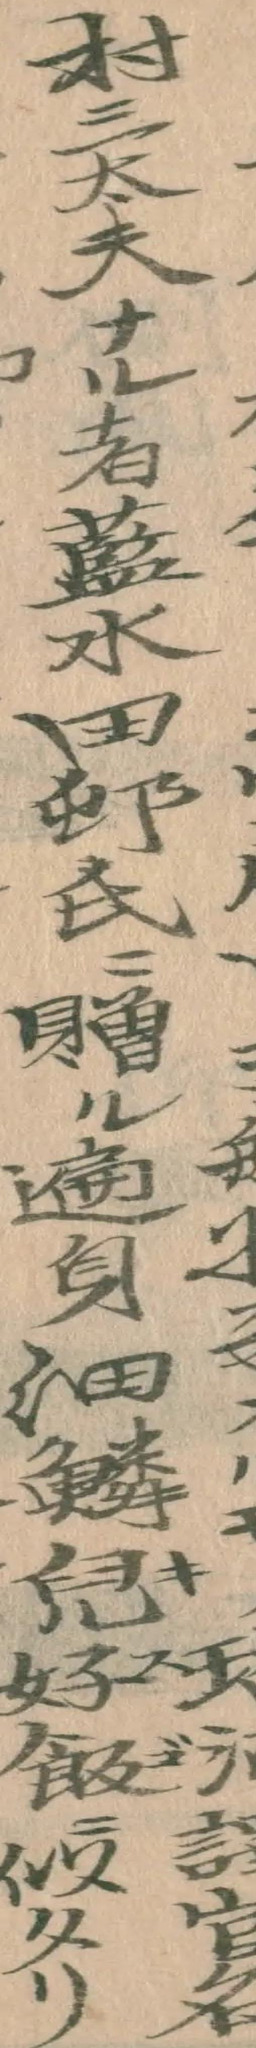村三太夫ナル者藍水田邨氏ニ贈ル遍身細鱗兒好飯ニ似タリ
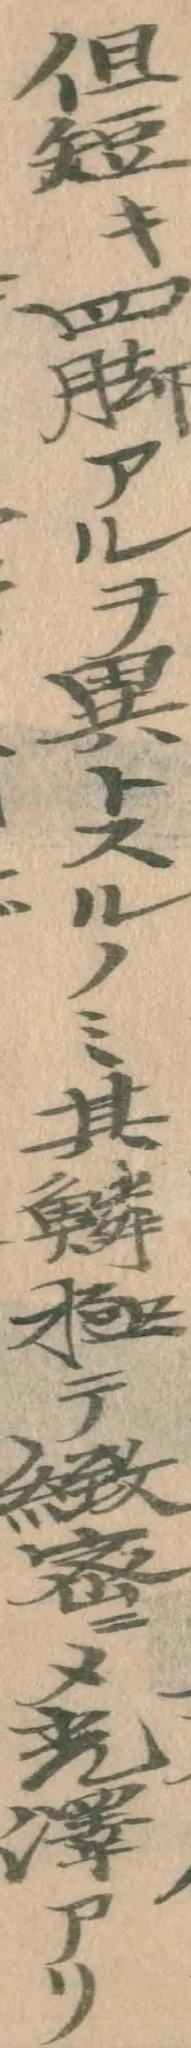但短キ四脚アルヲ異トスルノミ其鱗極テ緻密ニシテ光澤アリ
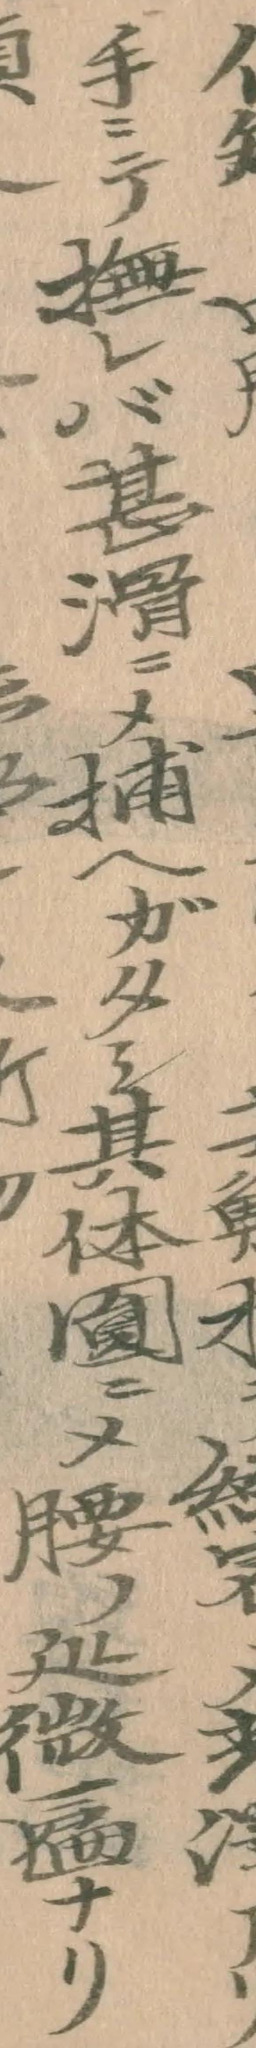手ニテ撫レバ甚滑ニシテ捕ヘガタシ其体圓ニシテ腰ノ処微匾ナリ
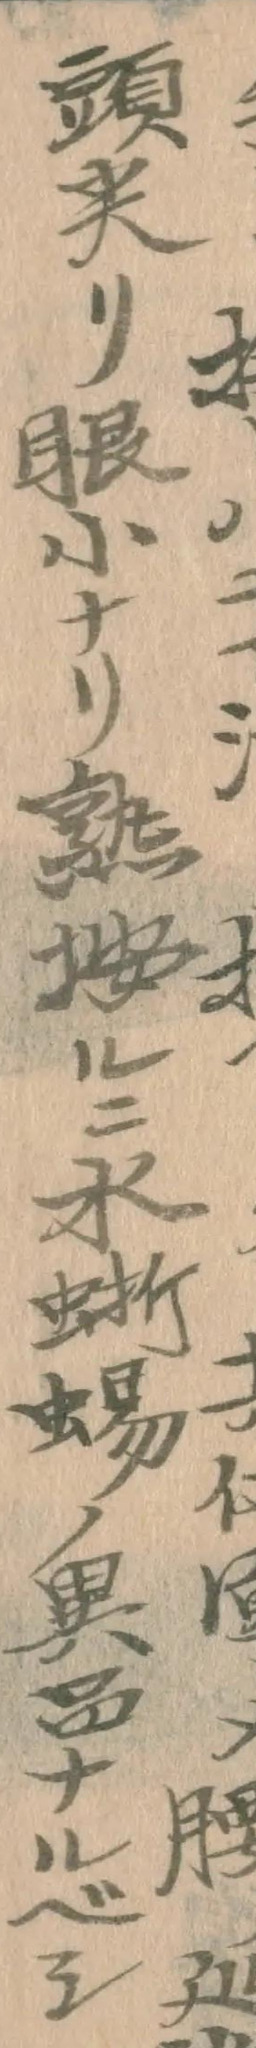頭尖リ眼小ナリ熟按ルニ水蜥蜴ノ異品ナルベシ
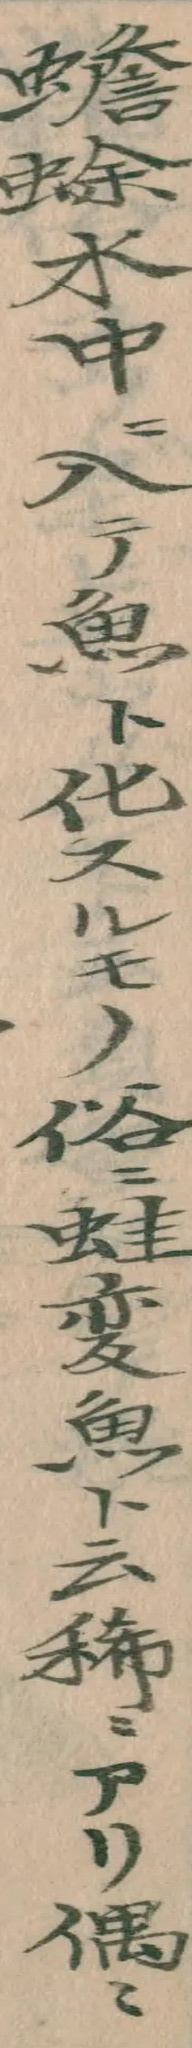蟾蜍水中ニ入テ魚ト化スルモノ俗ニ蛙変魚ト云稀ニアリ偶々
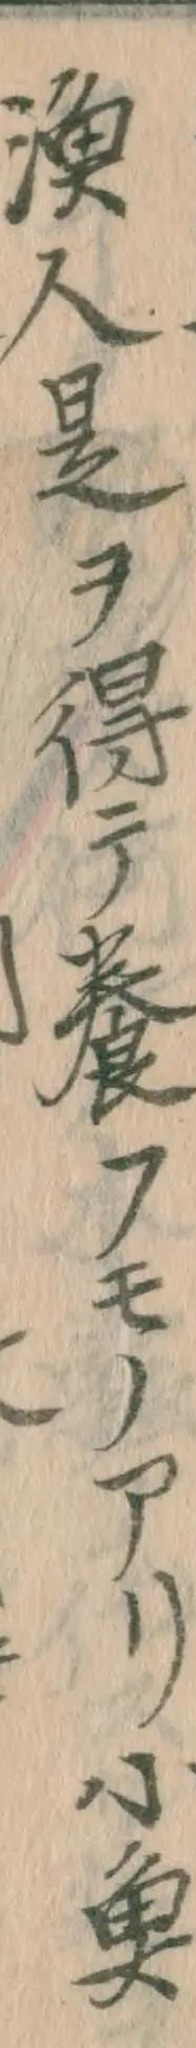漁人是ヲ得テ養フモノアリ小魚
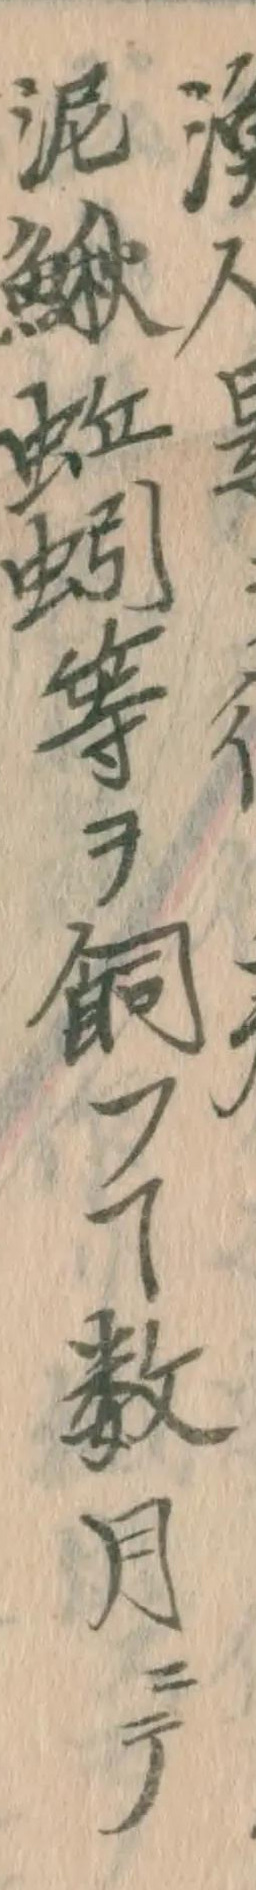泥鰍蚯蚓等ヲ飼フコト数月ニテ
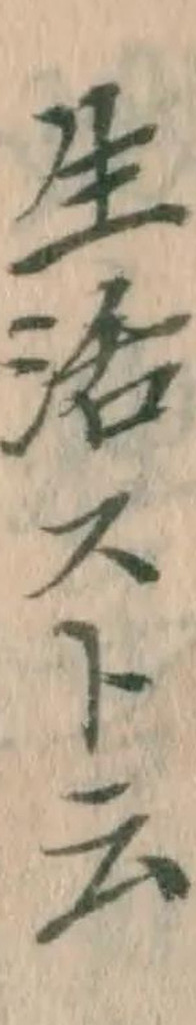生活スト云
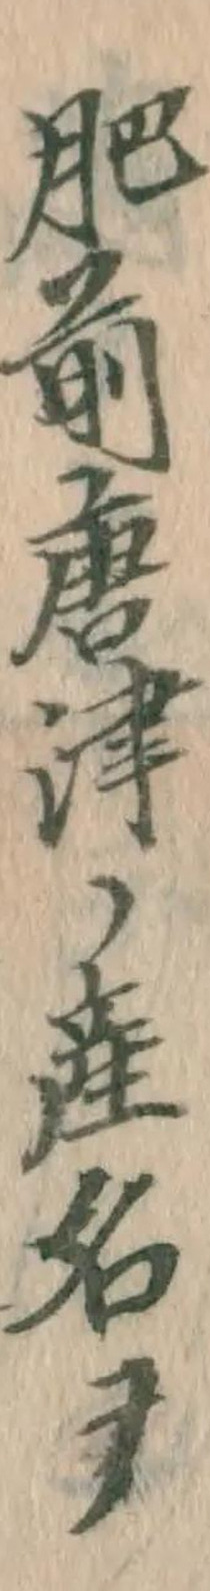肥前唐津ノ産名ヲ
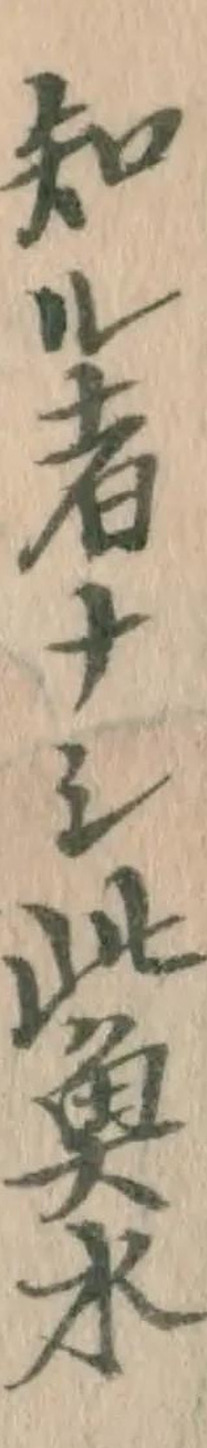知ル者ナシ此魚水
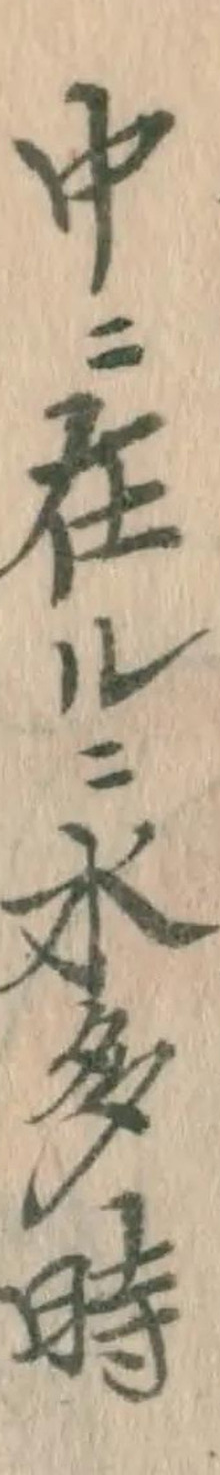中ニ在ルニ水多時
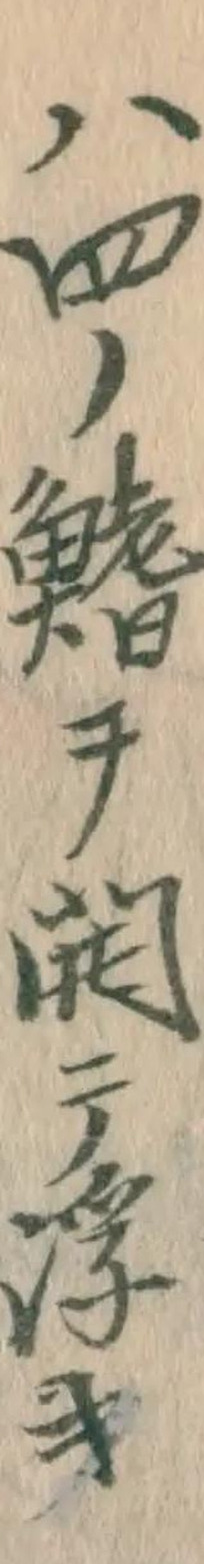ハ四ノ鰭ヲ開テ浮キ
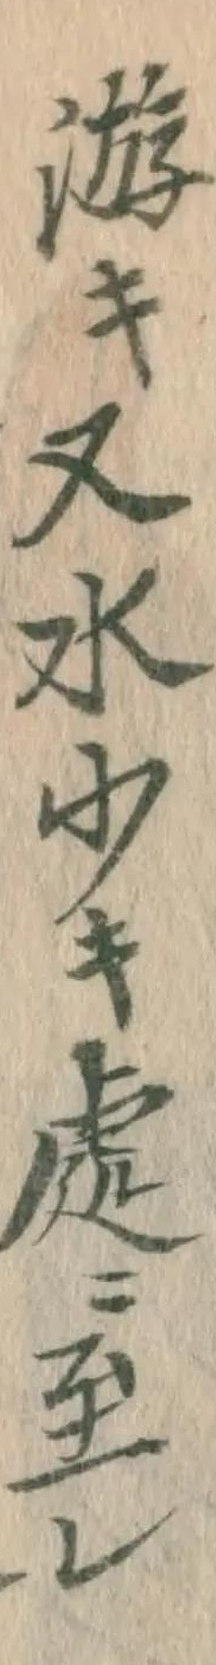游キ又水少キ處ニ至レ
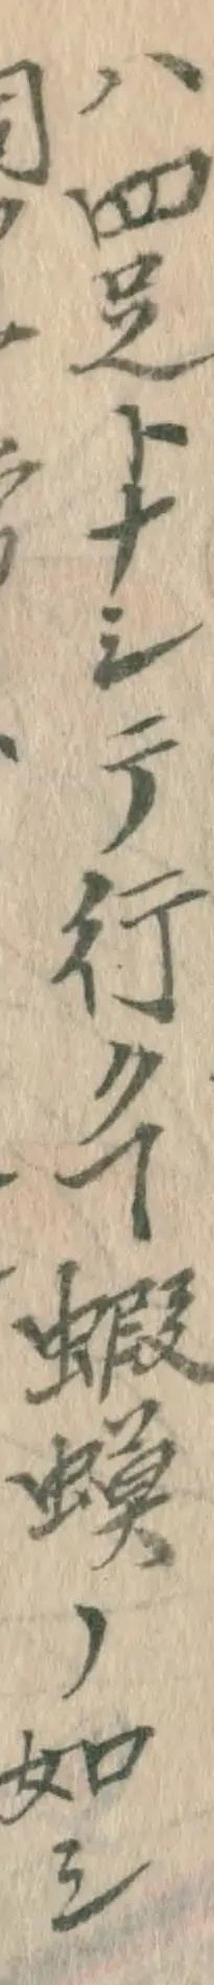ハ四足トナシテ行クコト蝦蟆ノ如シ
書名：千蟲譜 3巻. [1]
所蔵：国立国会図書館 National Diet Library, JAPAN
